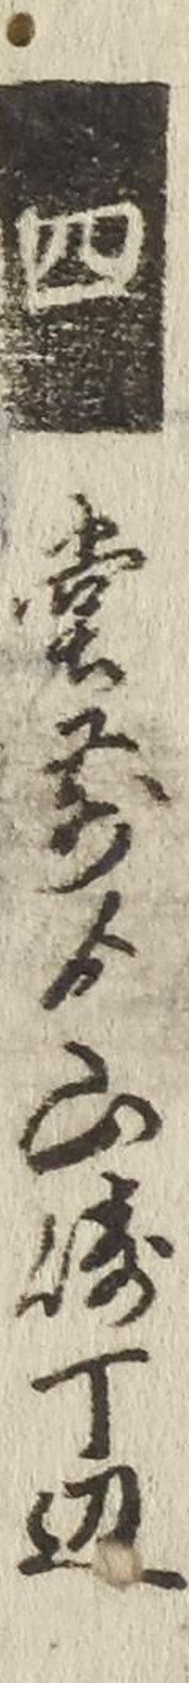四堂前ゟ山崎丁辺
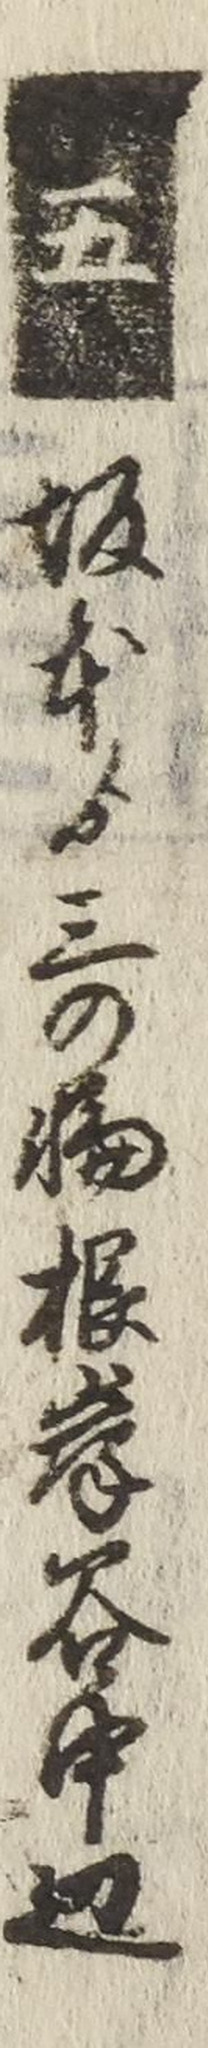五坂本ゟ三の輪根岸谷中辺
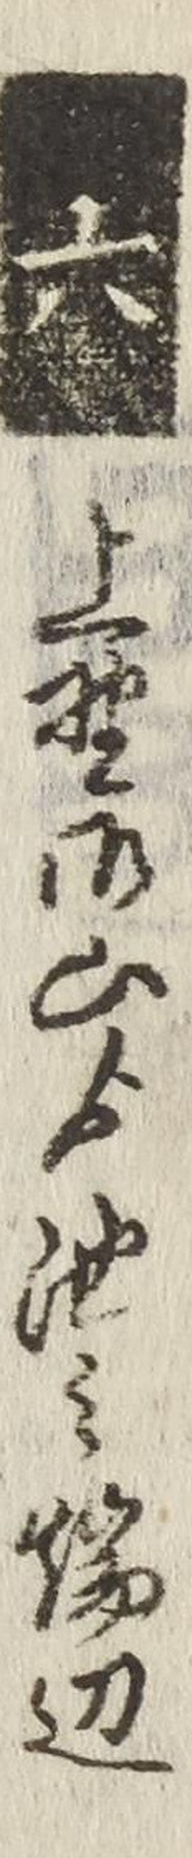六上野御山ゟ池の端辺
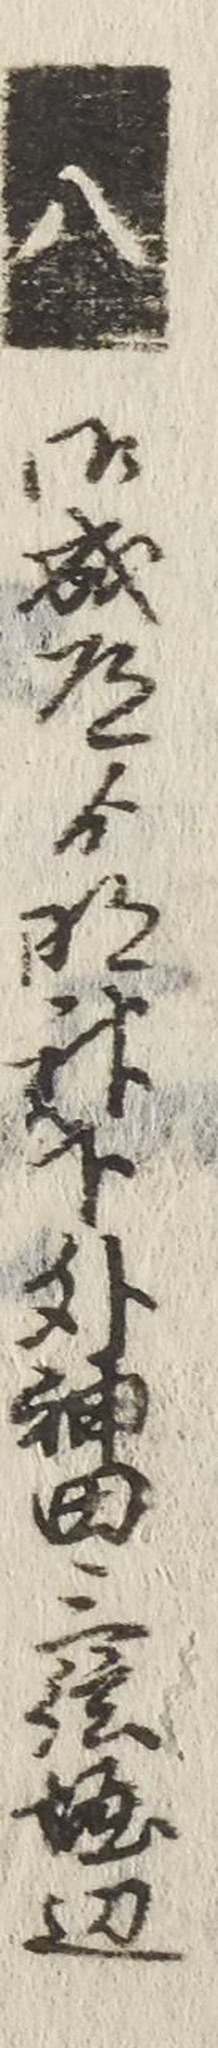八御成道ゟ明神した外神田三信堀辺
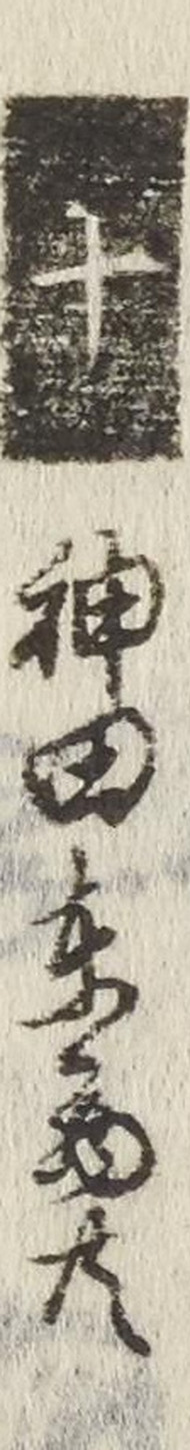十神田東西共
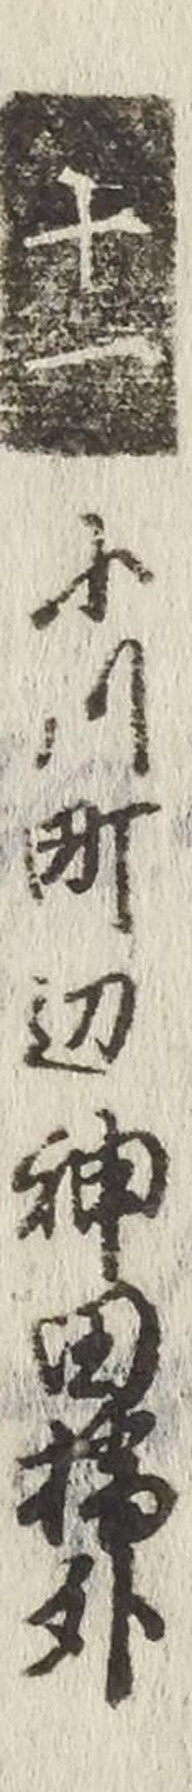十一小川町辺神田橋外
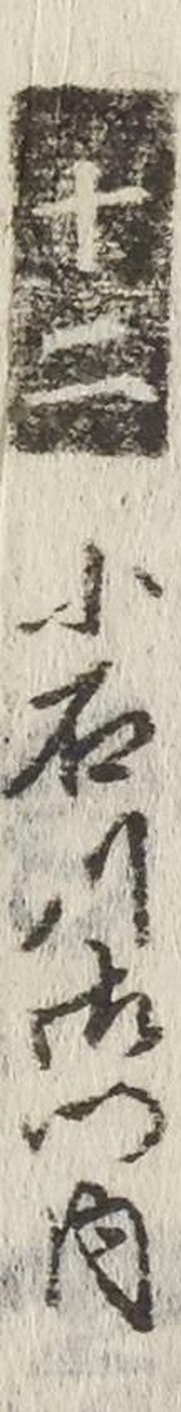十二小石川御門内
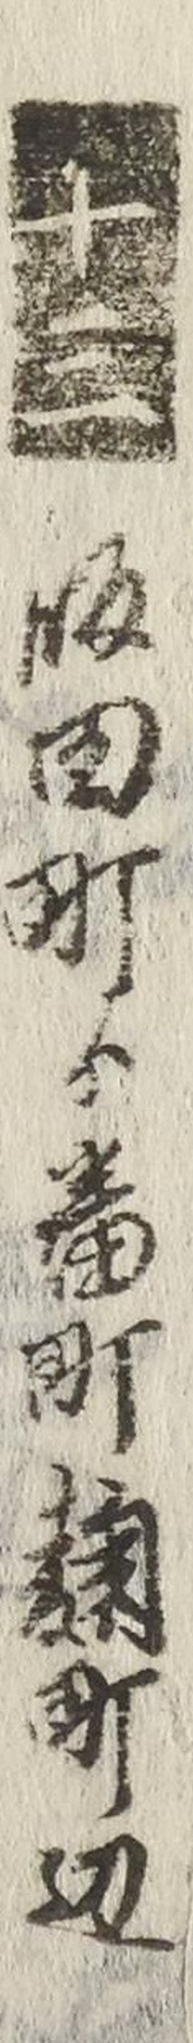十三飯田町ゟ番町麹町辺
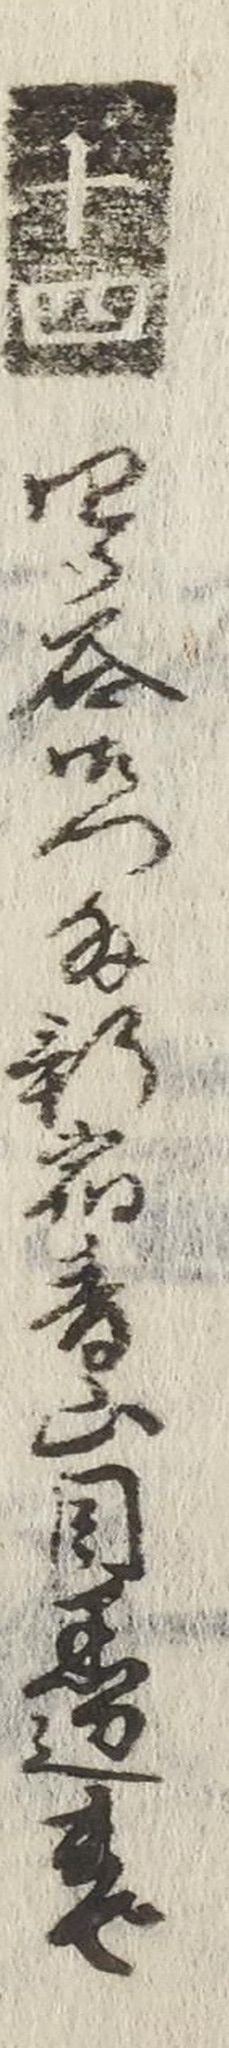十四四ッ谷御門外新宿青山目黒辺
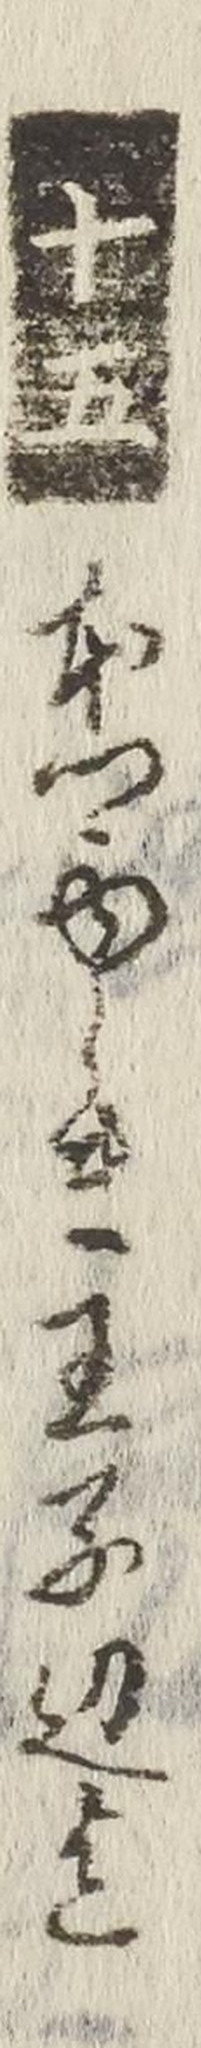十五本郷ゆしま王子辺迄
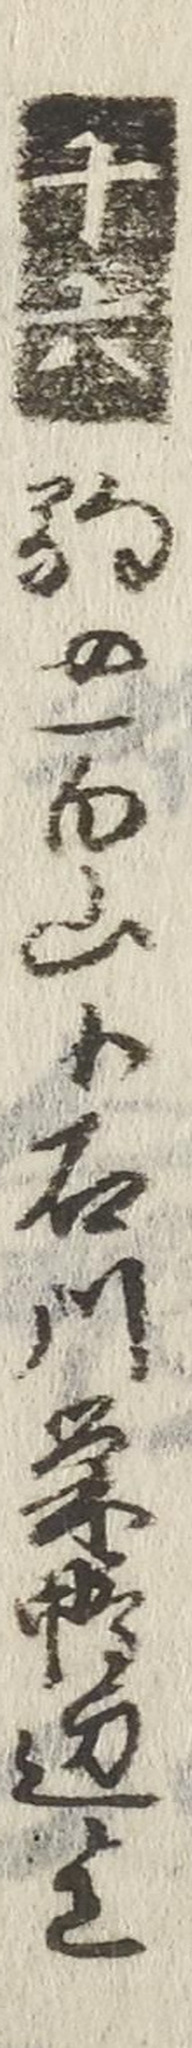十六駒込白山小石川巣鴨辺迄
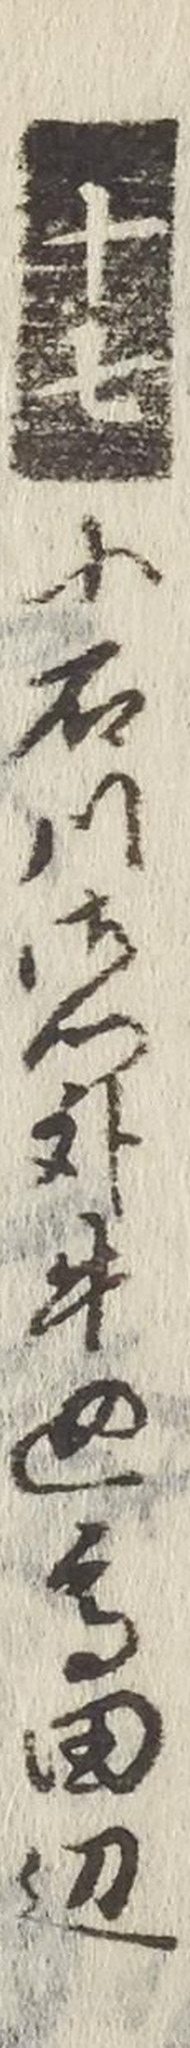十七小石川御門外牛込高田辺
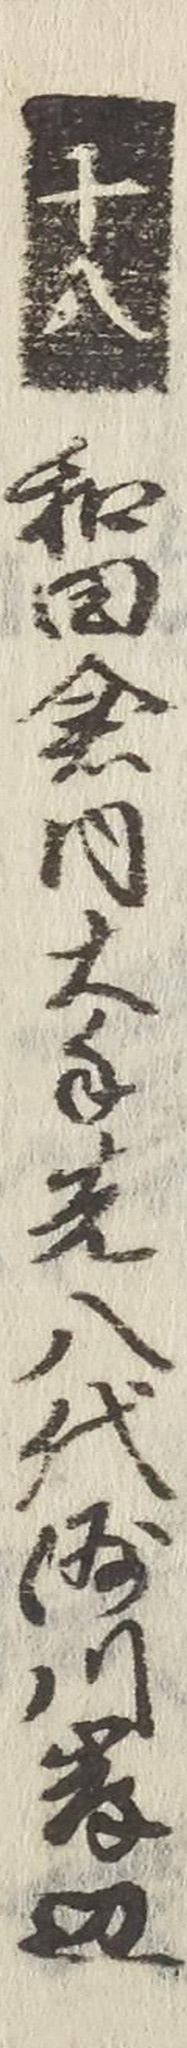十八和田倉門大手先八代洲川岸辺
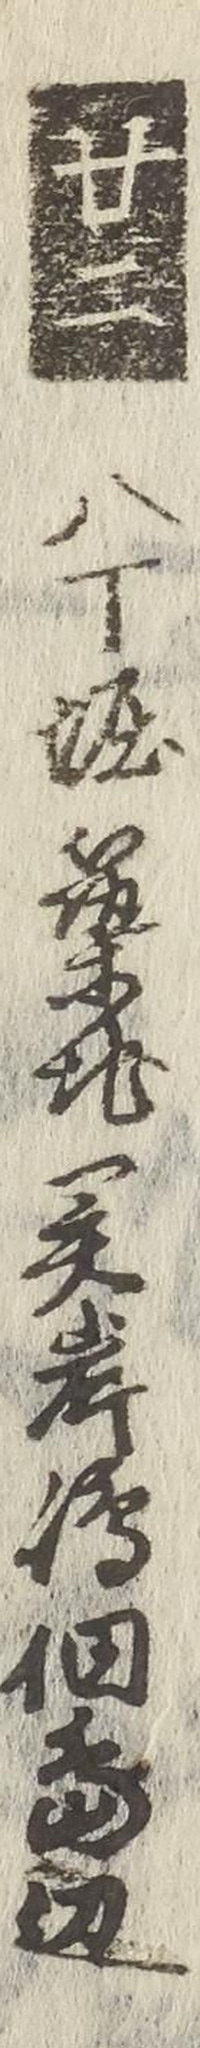廿二八丁堀築地霊岸嶋佃嶋辺
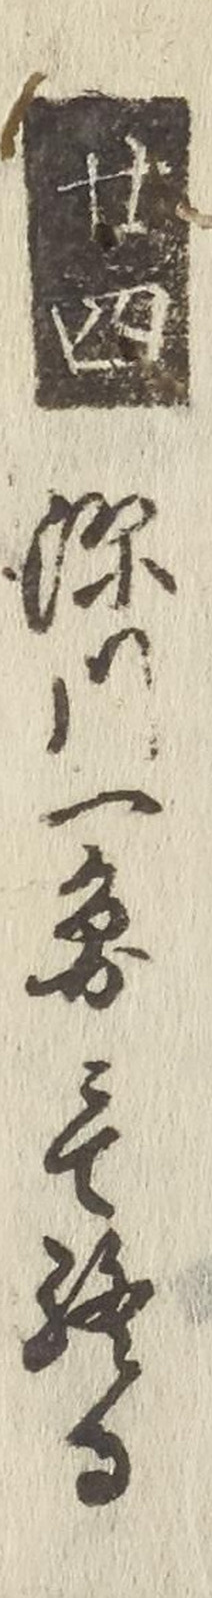廿四深川一円にて終る

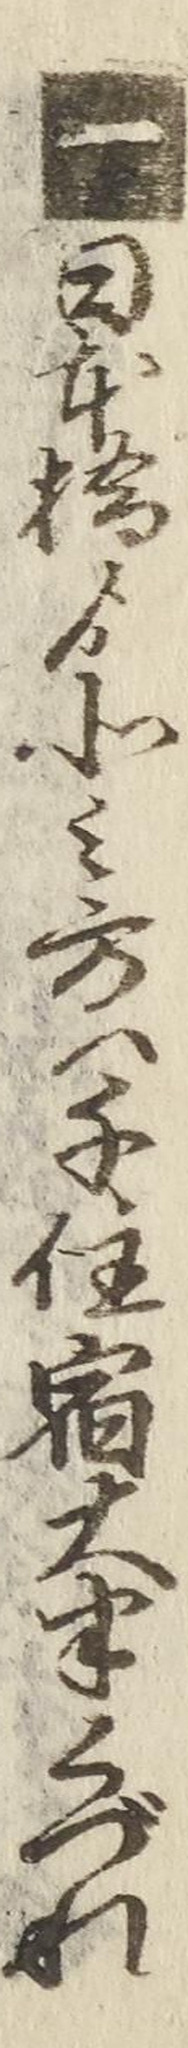一日本橋ゟ北之方は千住宿大半くづれ
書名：地震出火　男女死人怪我人書上之寫
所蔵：東京大学地震研究所図書室 Earthquake Research Institute Library, The University of Tokyo, JAPAN
